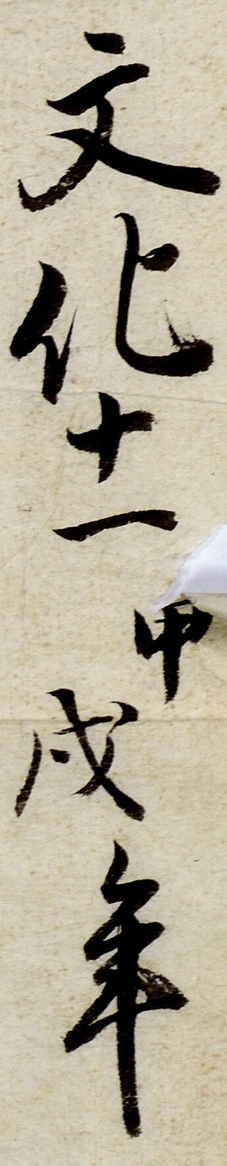文化十一甲戌年
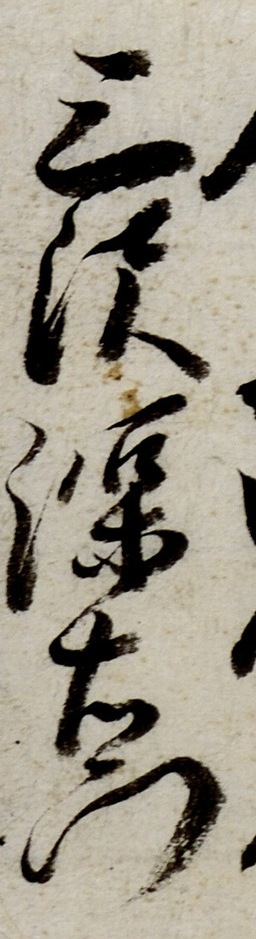三沢深右衞門

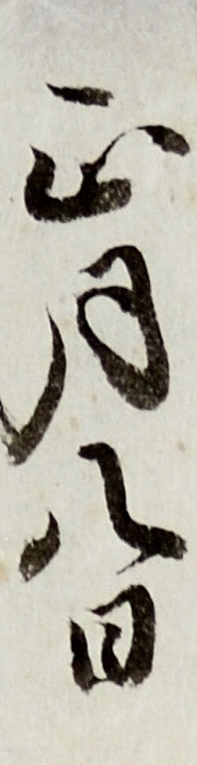正月ハ日
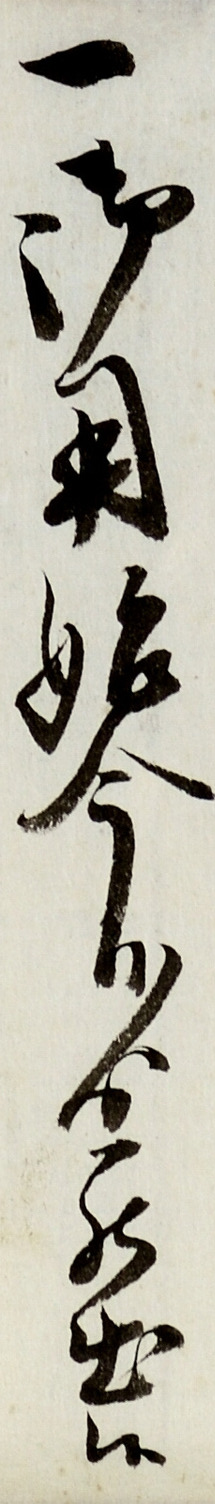一御用始今日より罷出候
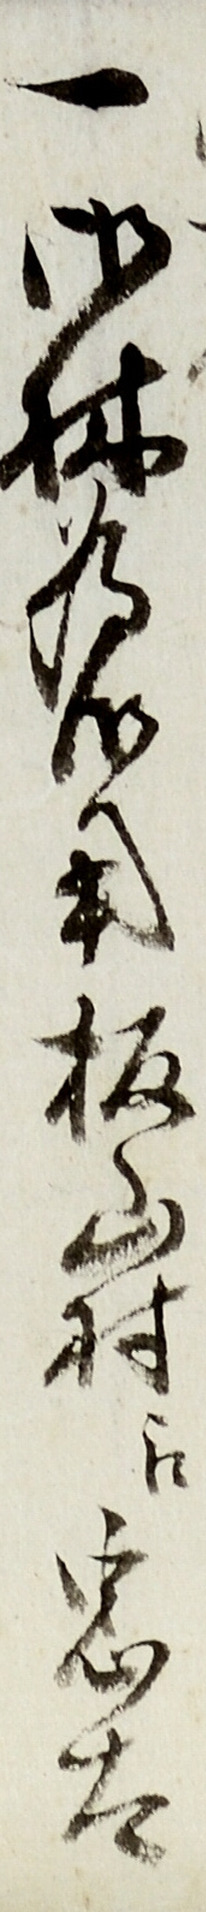一御林為御用板山村え忠太
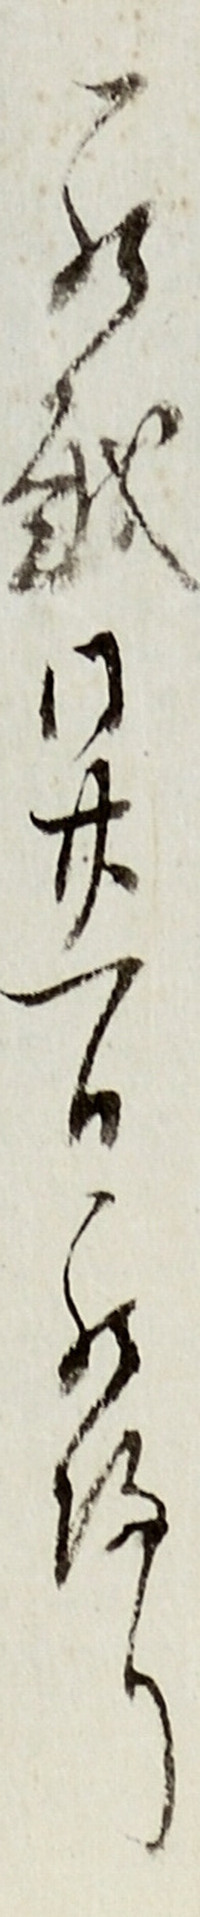罷越同廿一日罷帰り候
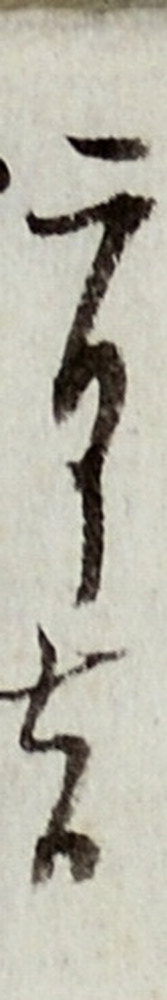ニ月七日
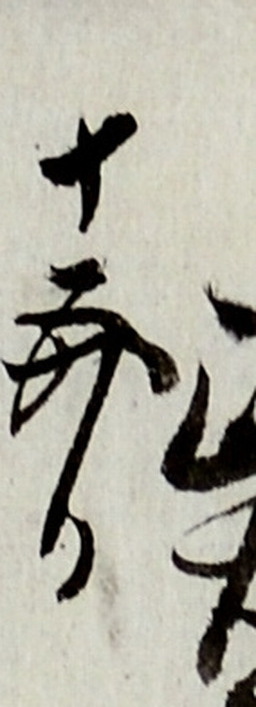十五日
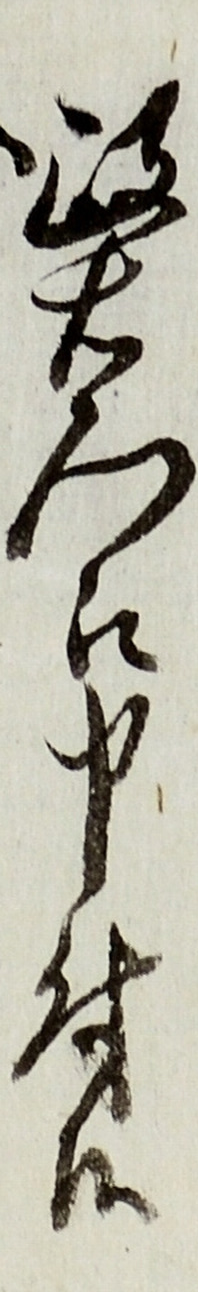政右衛門え申付候
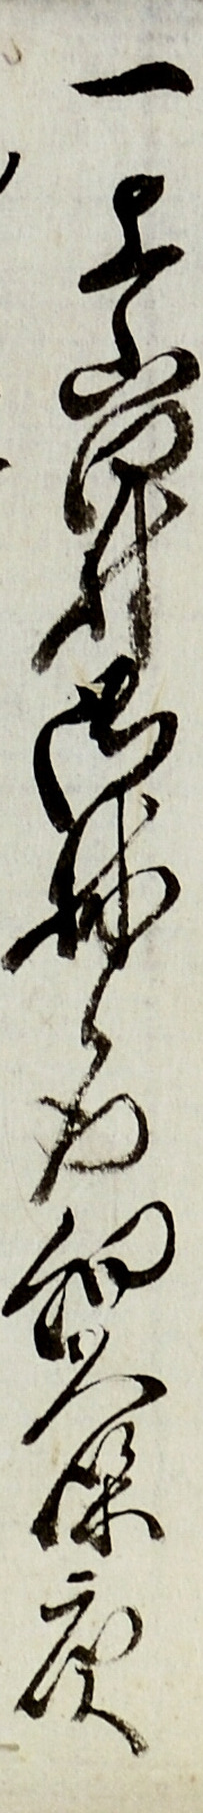一上山田村御林之為細久保
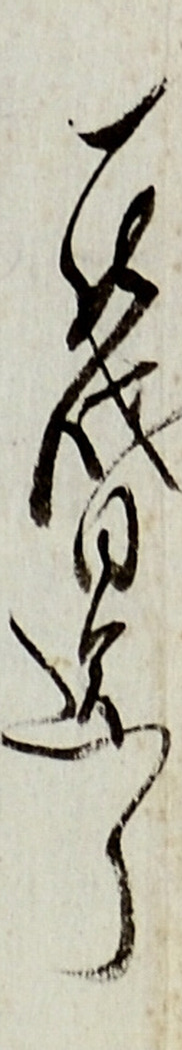罷越日送り
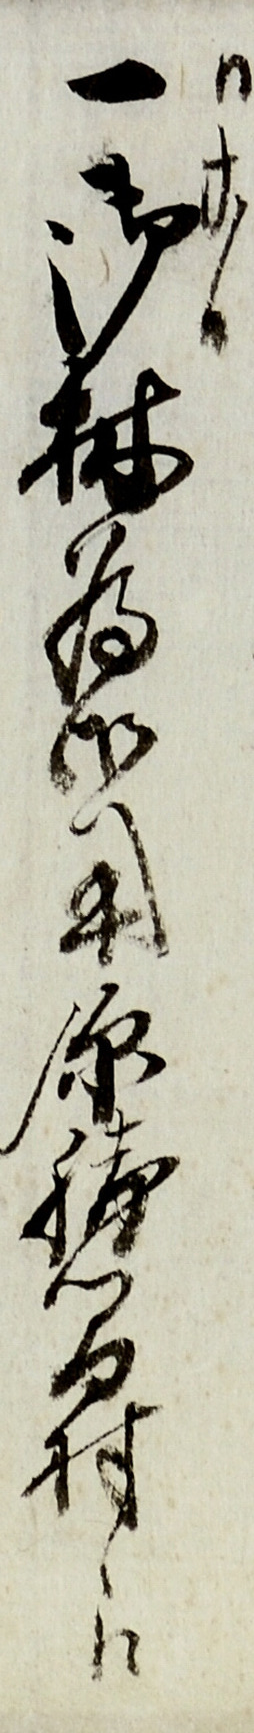一御林為御用源間村え
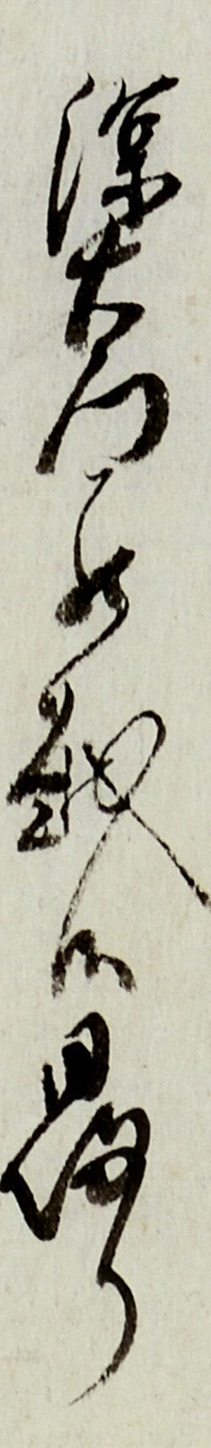深右衛門罷越候日帰り
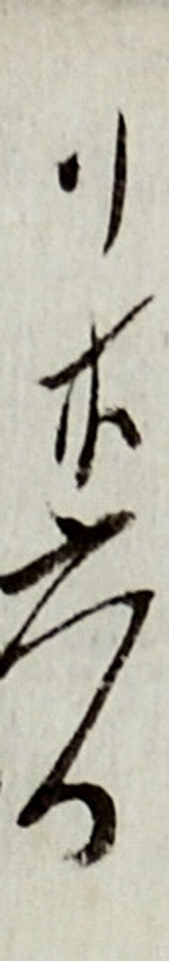同廿六日
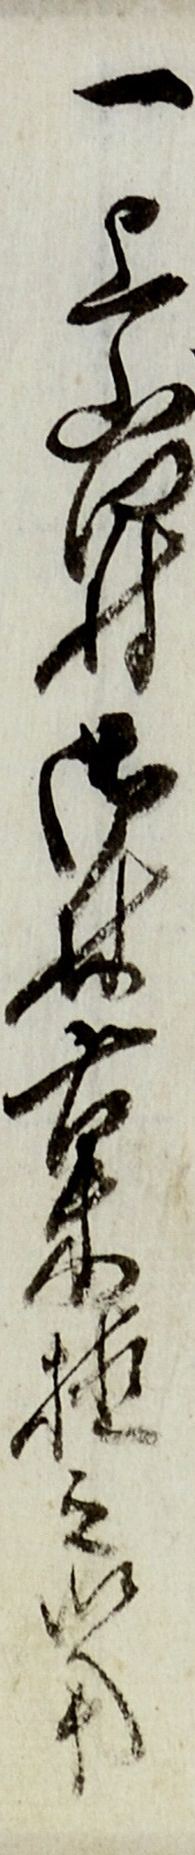一上山田村御林苗木植立御用
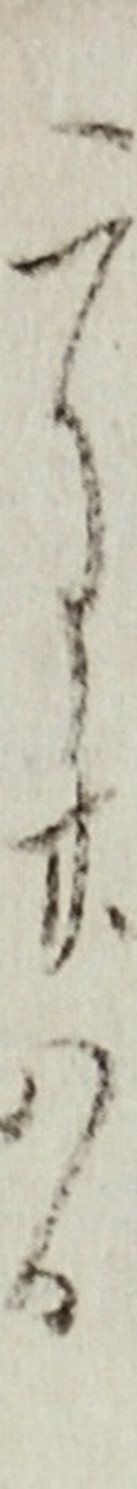ニ月廿ハ日
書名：諸事御用控
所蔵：伊那市立高遠町図書館・合同会社AMANE
